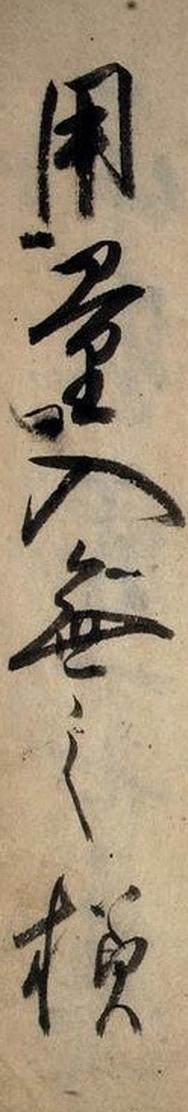用量入無之様

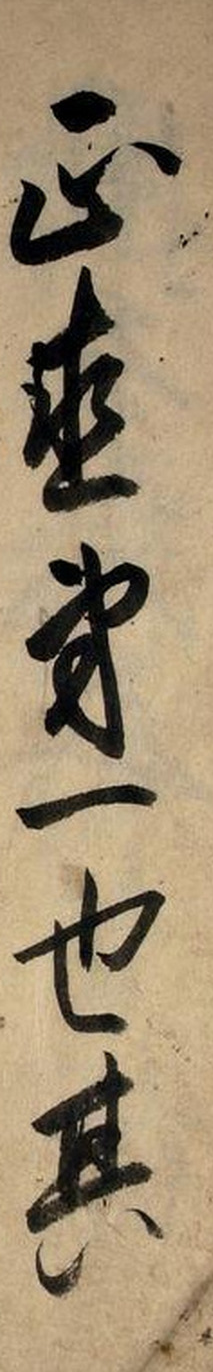正直第一也其
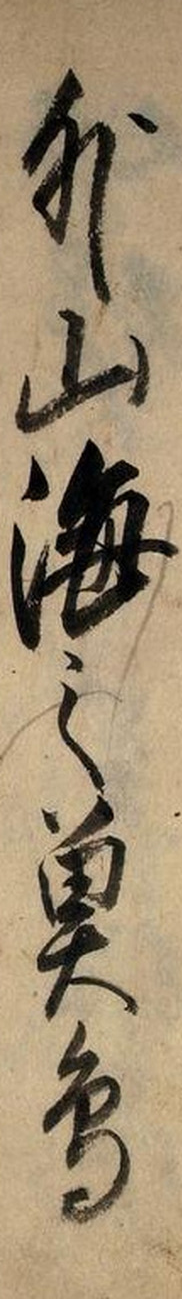外山海之魚鳥
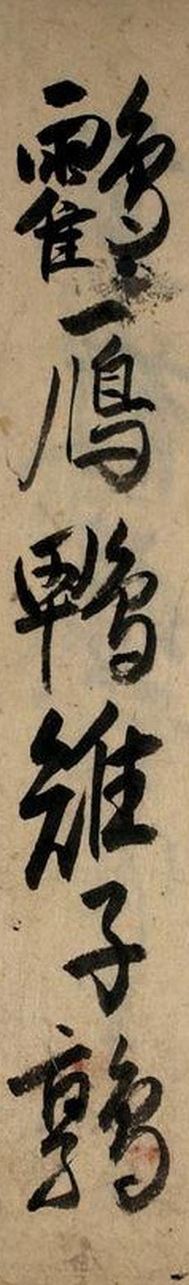鶴雁鴨雉子鶉
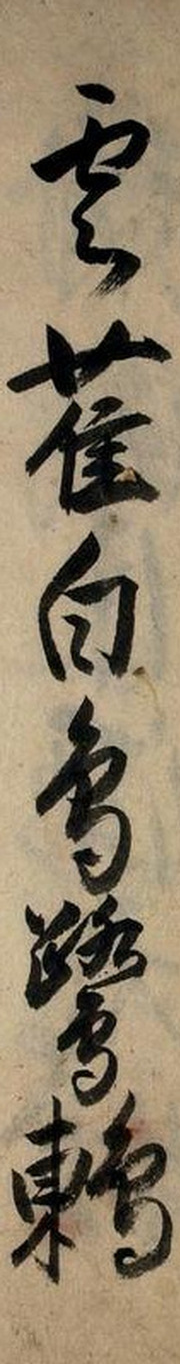雲萑白鳥鷺鶇
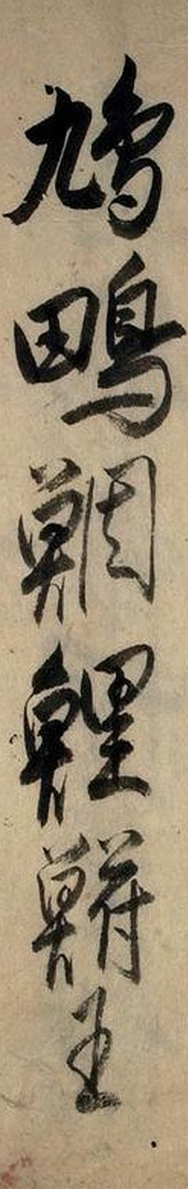鳩鴫鯛鯉鮒王
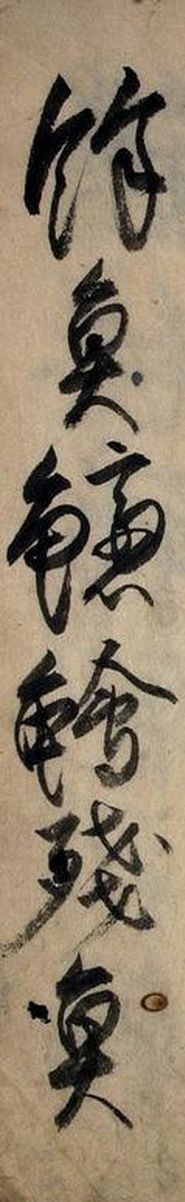余魚鱸鱠残魚

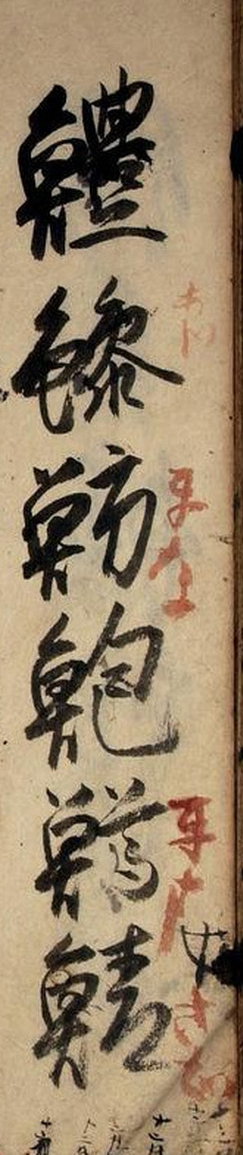鱧鰺鮑魴鱒鯖
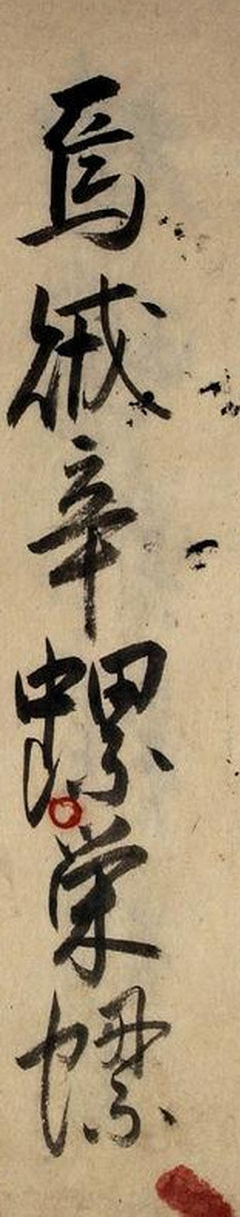烏賊辛螺栄螺
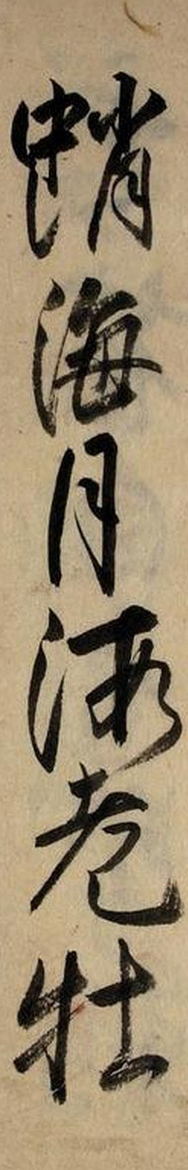蛸海月海老牡
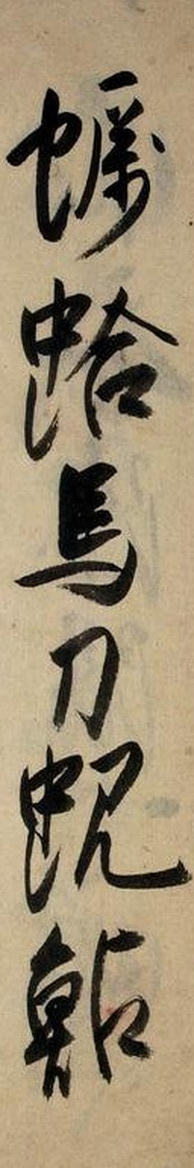蠣蛤馬刀蜆鮎
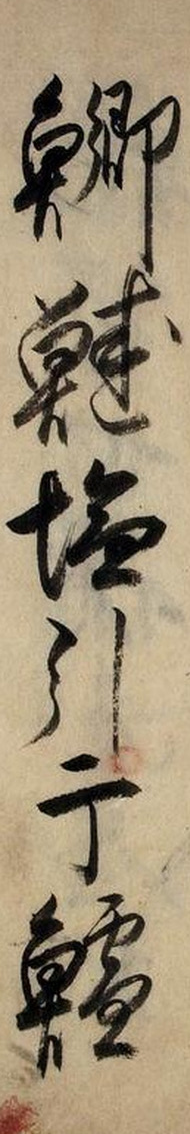鱜鮭塩引干鱈
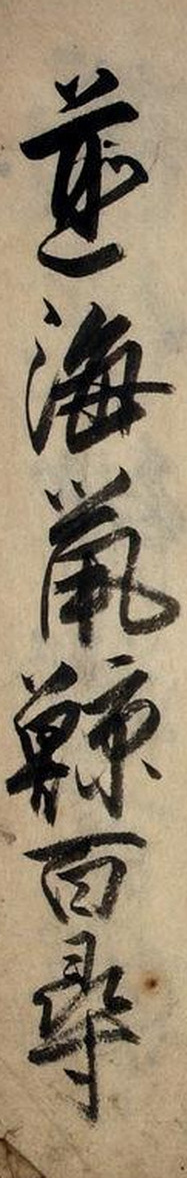煎海鼠鯨百尋

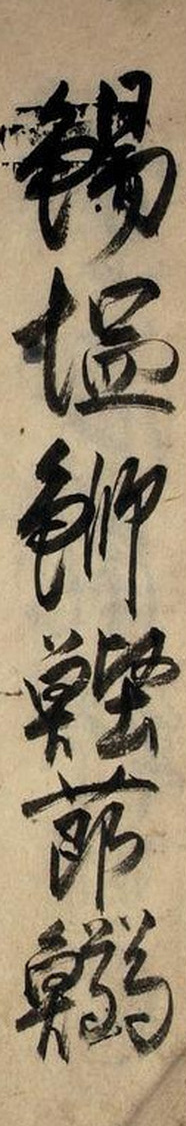鯣塩鰤鰹節鰯
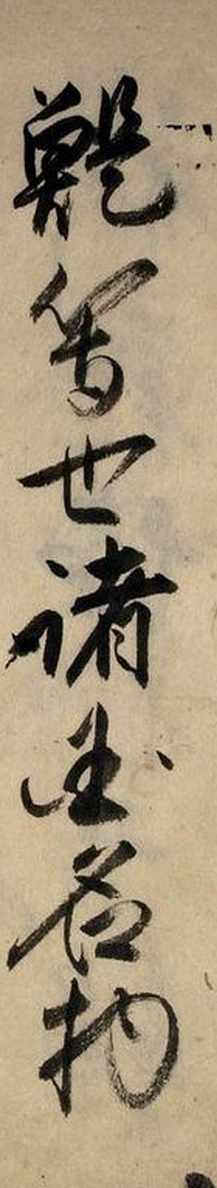鯷等也諸国名物
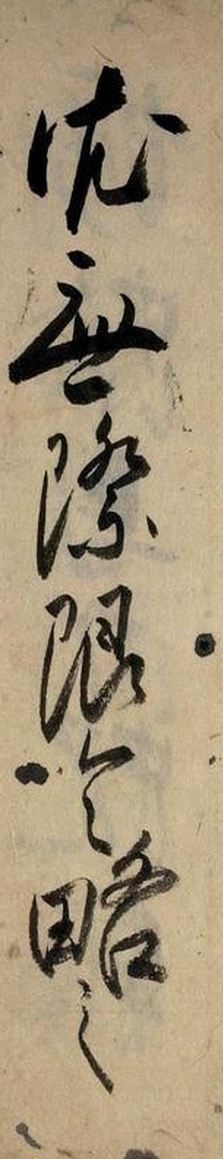依無際限令略之
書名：商売往来（往来物、手習手本）
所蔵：福井県文書館 Fukui Prefectural Archives
